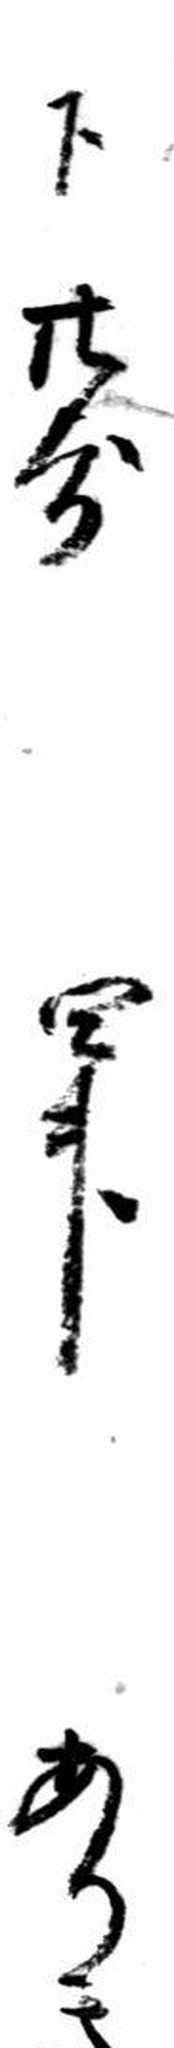下廿歩四升ありき
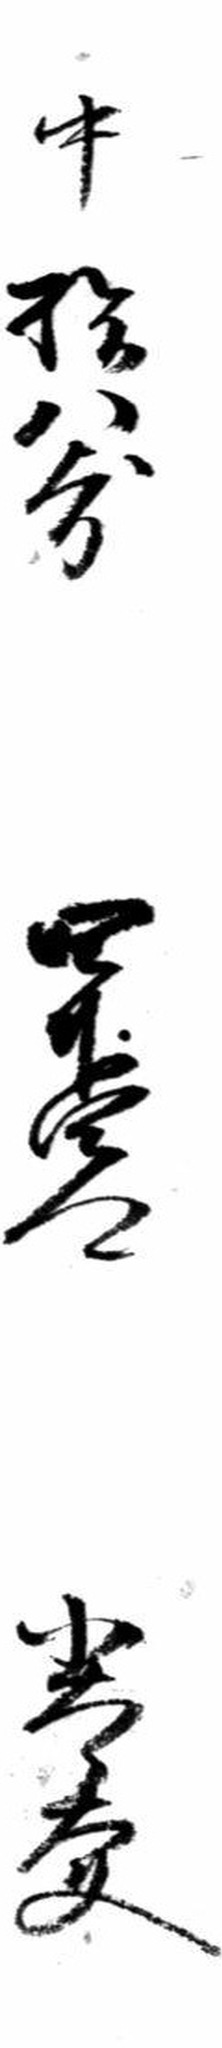中拾八歩四升四合小大郎大夫
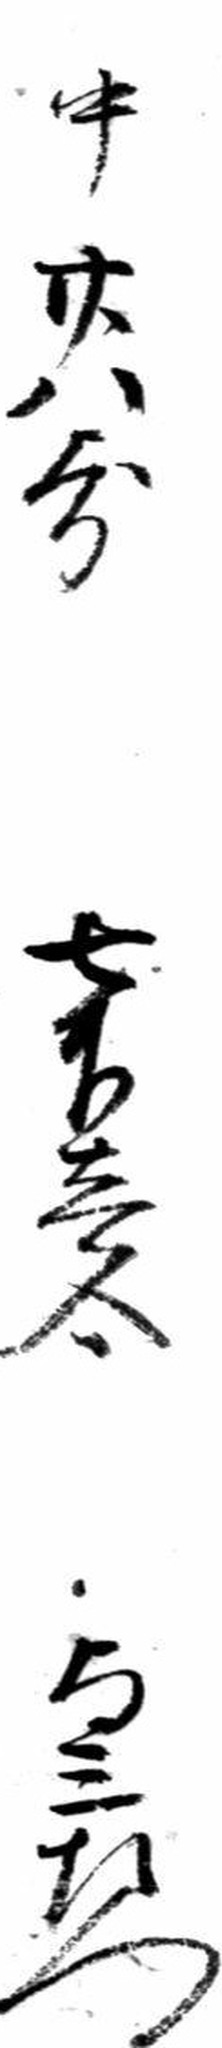中廿八歩七升壱合与三左衛門

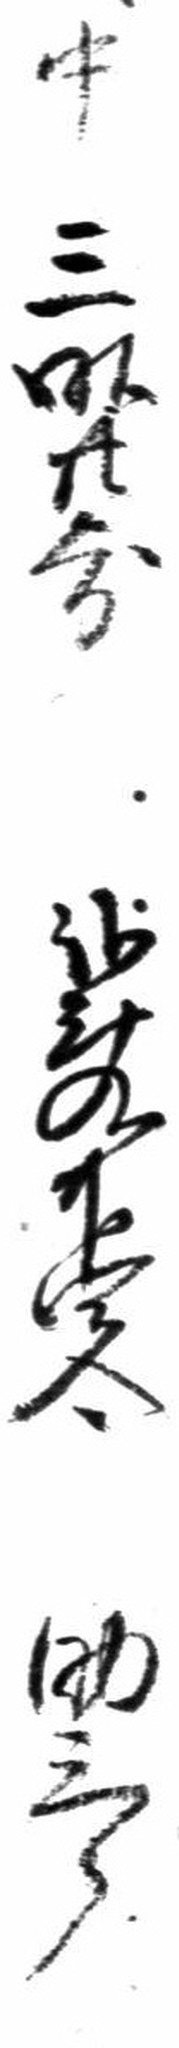中三畝廿歩弐斗九升四合助三郎
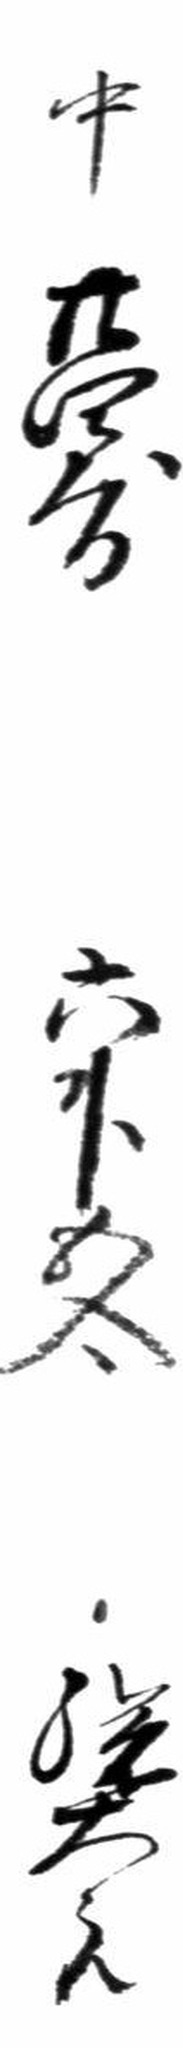中廿四歩六升五合孫大郎
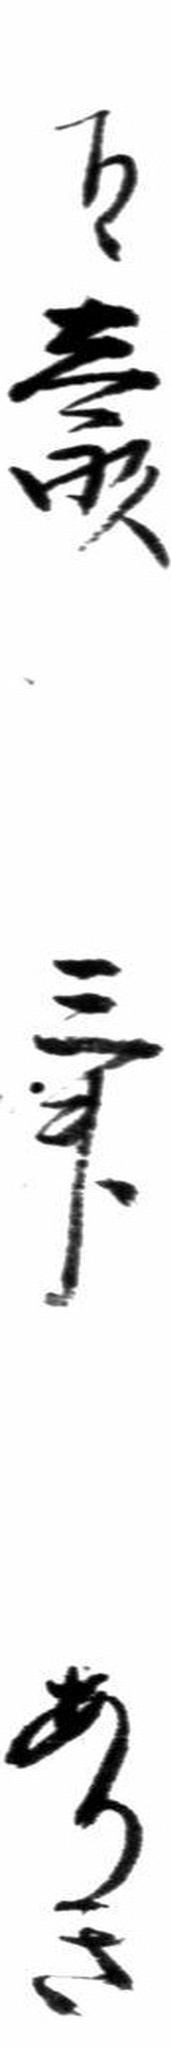下々壱畝三升ありき
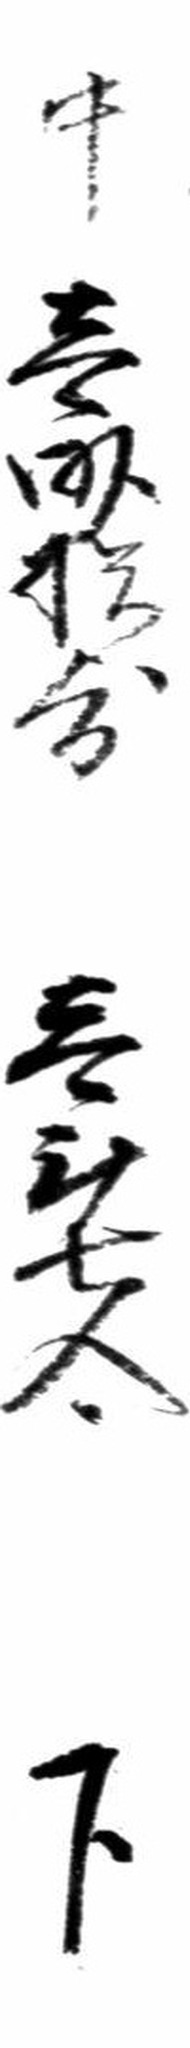中壱畝拾歩壱斗七合下
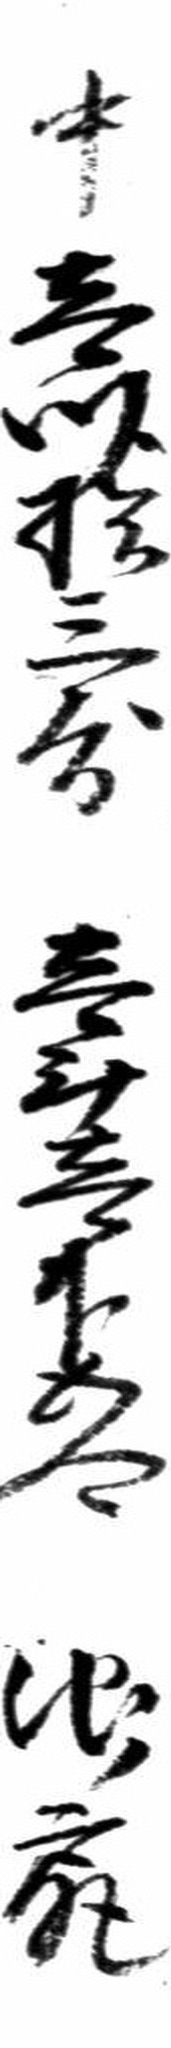中壱畝拾三歩壱斗壱升五合池ノ尻
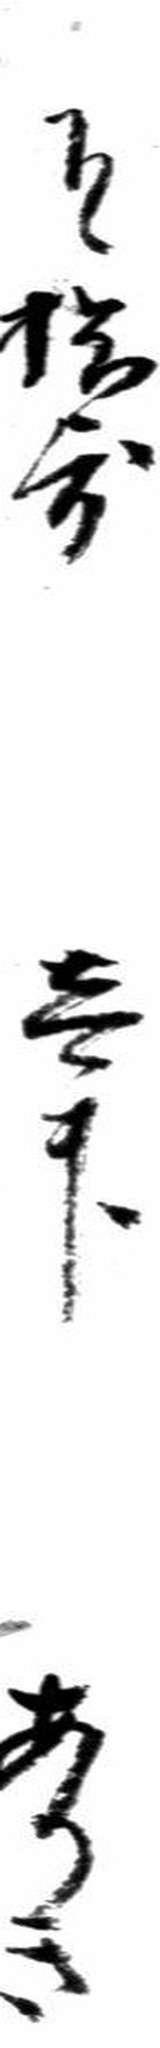下々拾歩壱升ありき
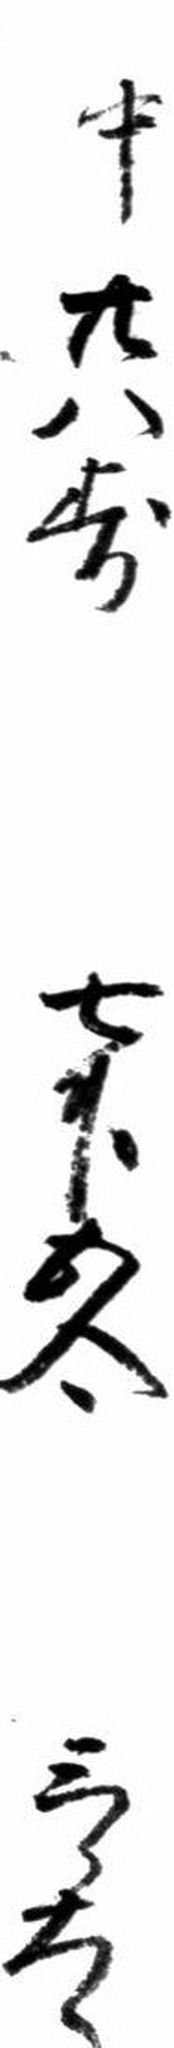中廿八歩七升五合三郎大郎
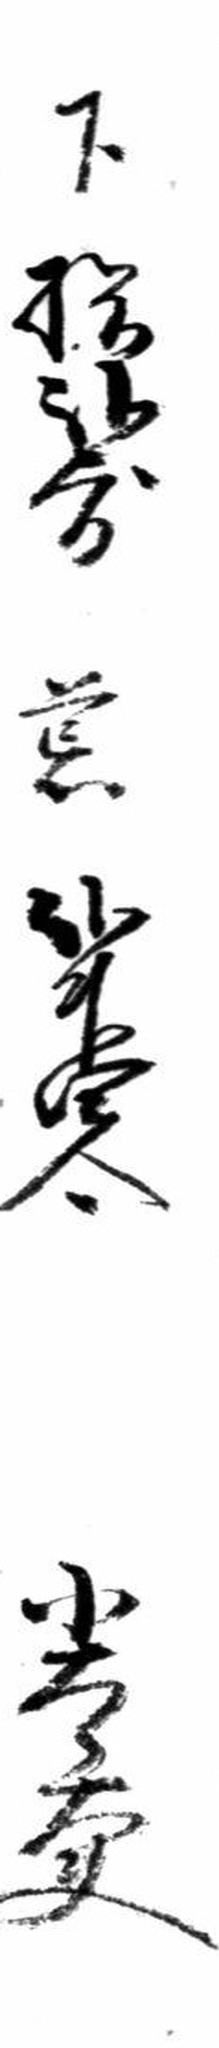下拾弐歩荒弐升四合小大郎大夫
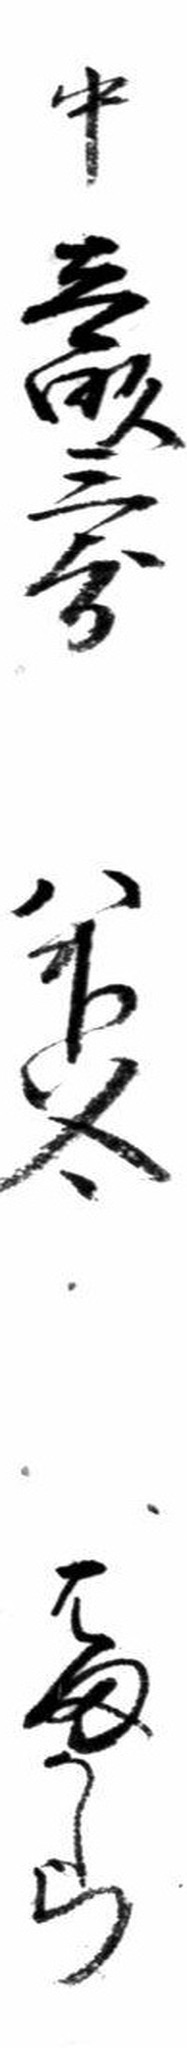中壱畝三歩八升八合はまかしら
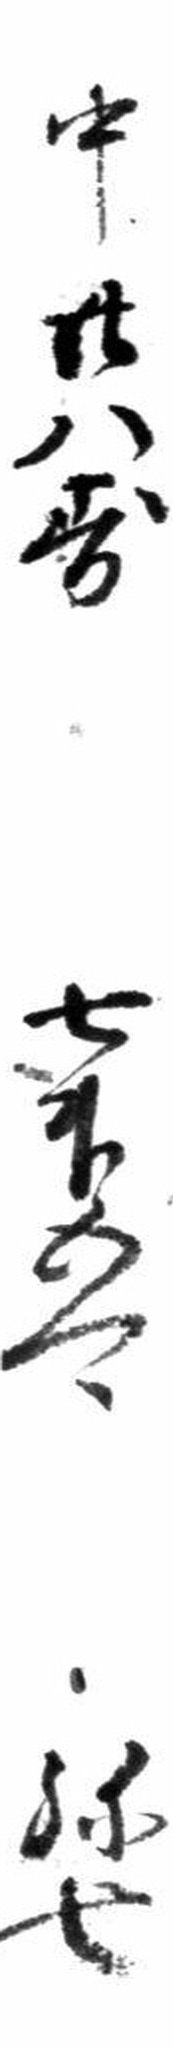中廿八歩七升五合弥七
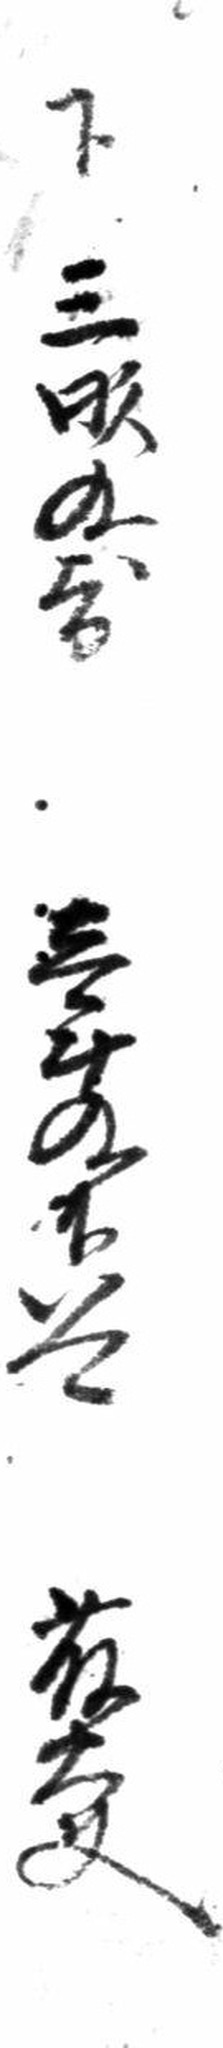下三畝九歩壱斗九升八合藤大夫

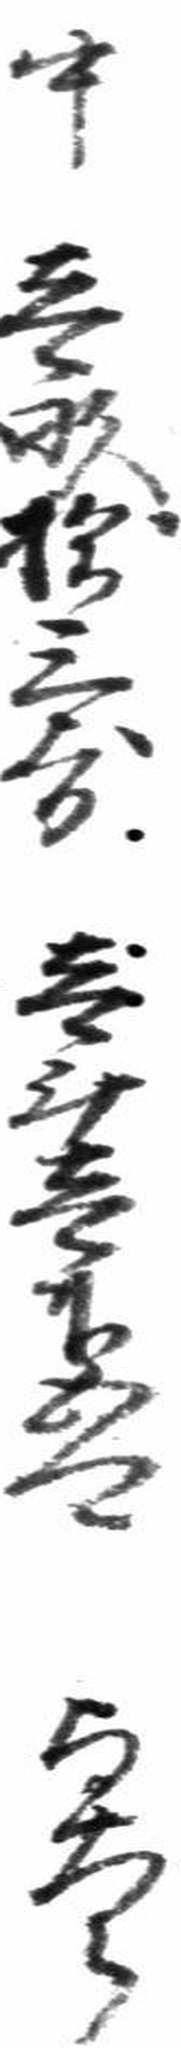中壱畝拾三歩壱斗壱升五合与大郎
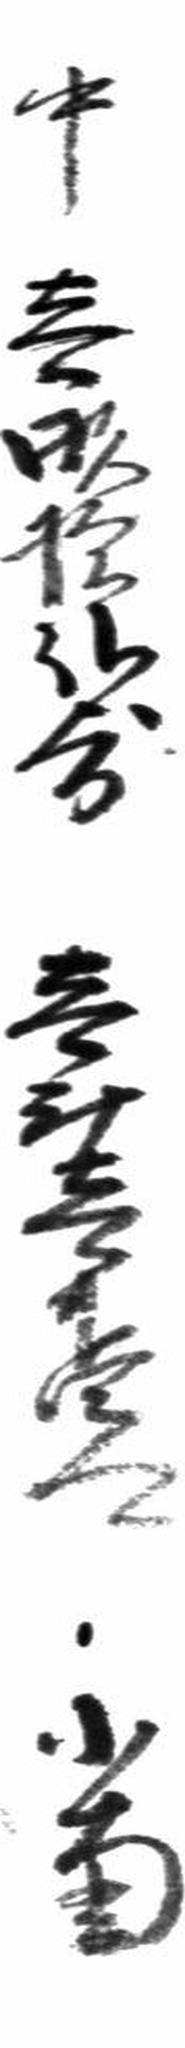中壱畝拾弐歩壱斗壱升四合小南
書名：若州三方郡之内世久見浦御検地帳（世久見浦検地帳写）
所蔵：福井県文書館 Fukui Prefectural Archives
